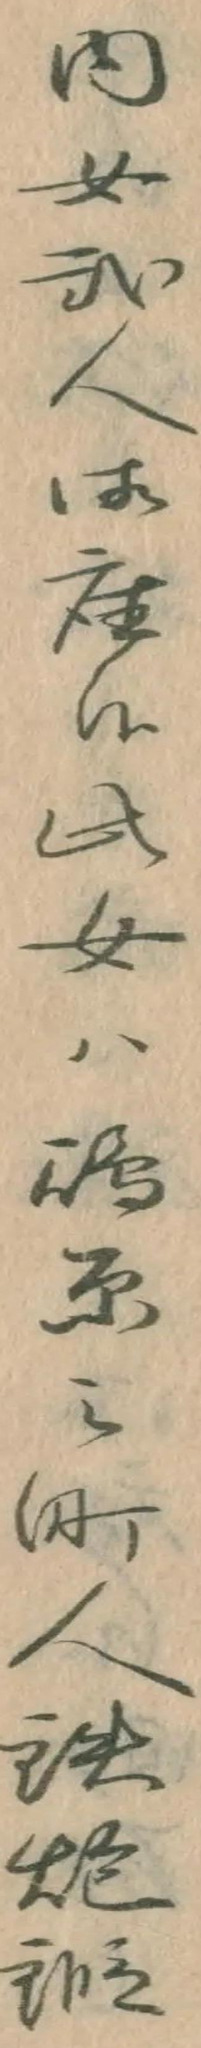内女弐人御座候此女は島原之町人鉄炮鍛
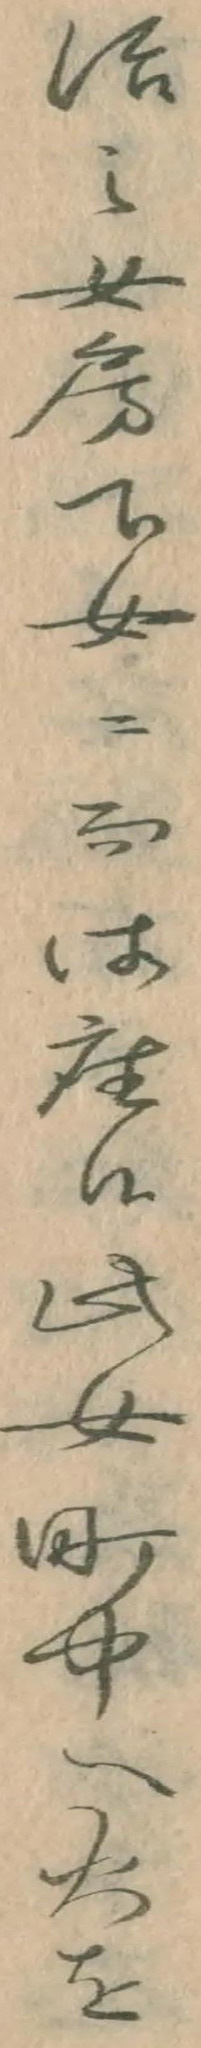冶之女房下女に而御座候此女町中へ火を

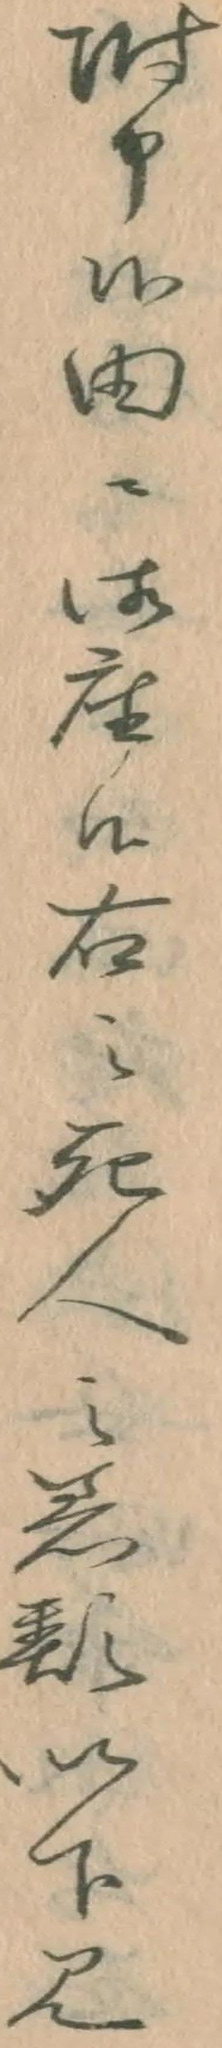附申候由に御座候右之死人之着類以下見
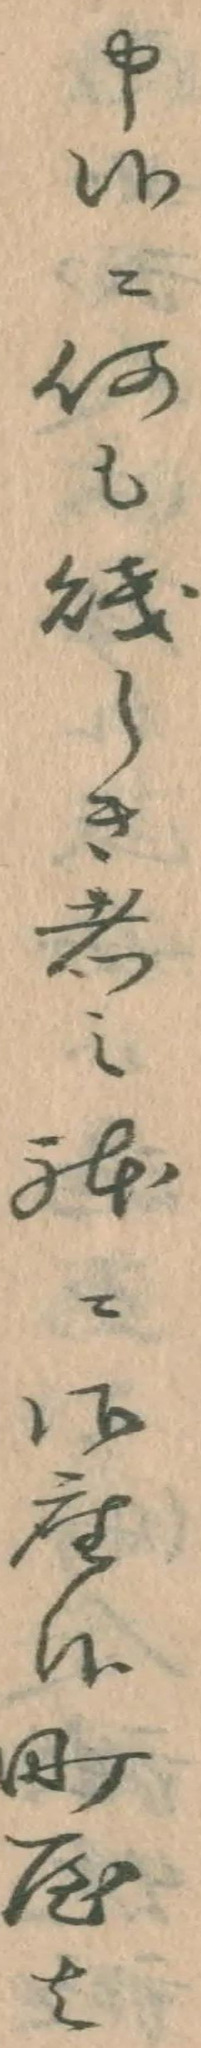申候に何も賤しき者之躰に御座候町屋者
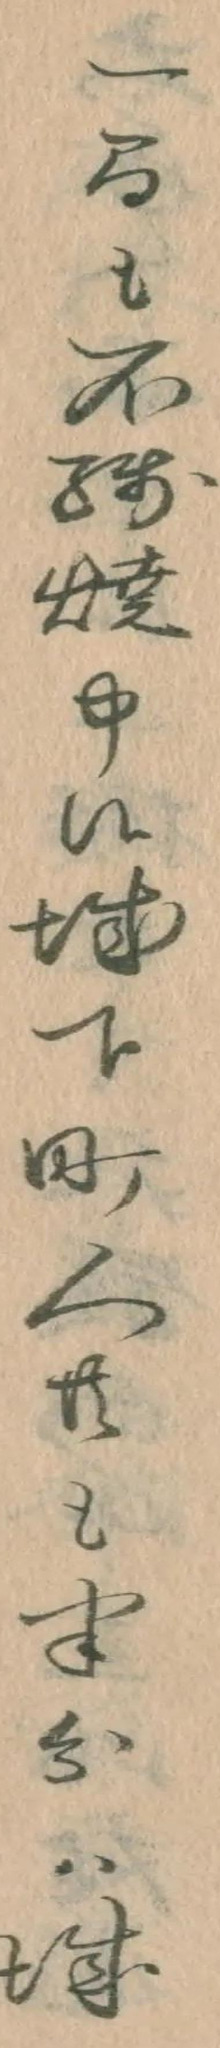一間も不残焼申候城下町人共も半分は城
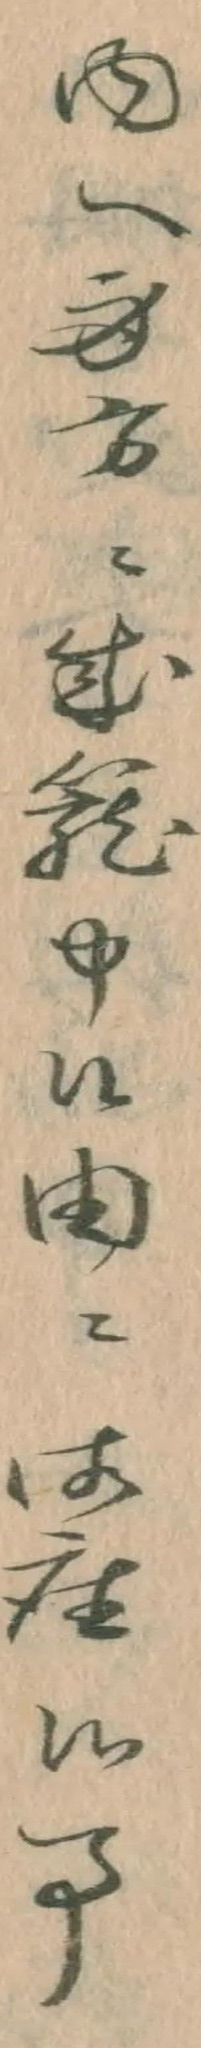内へ身方に成籠申候由に御座候事
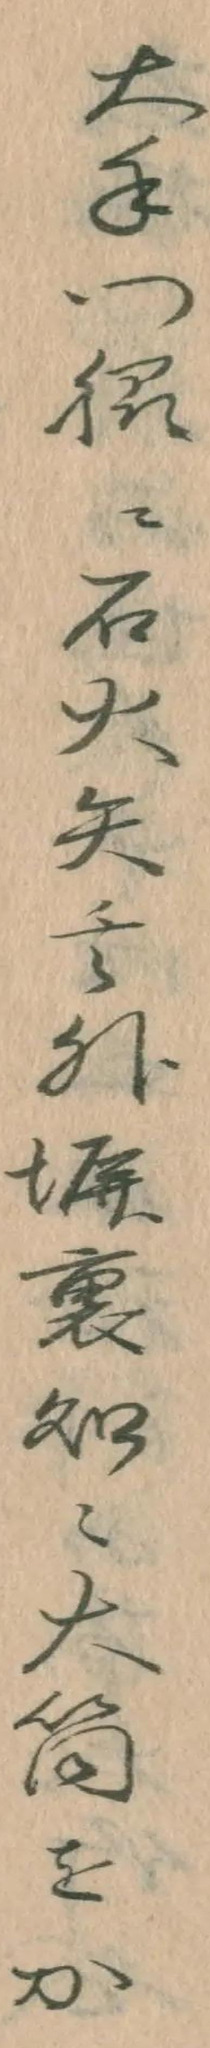一大手門脇に石火矢其外塀裏処に大筒を加
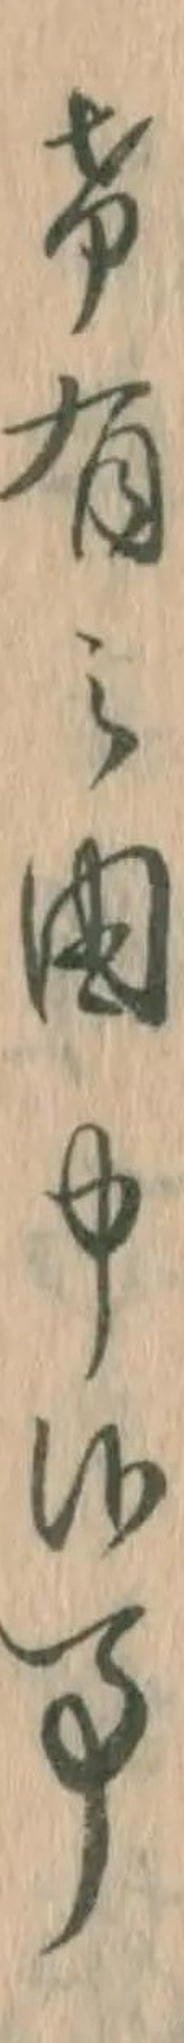希有之由申候事
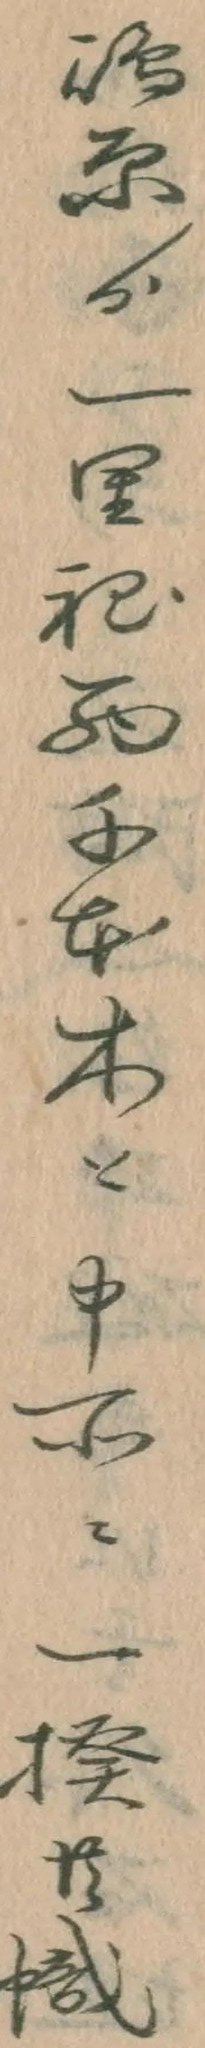一島原ゟ一里程西千本木と申所に一揆共幟
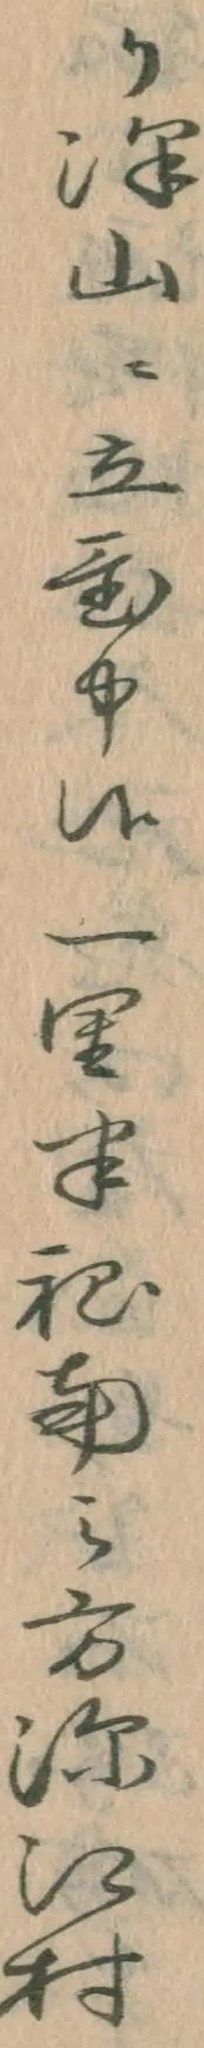り深山に立置申候一里半程南之方深江村
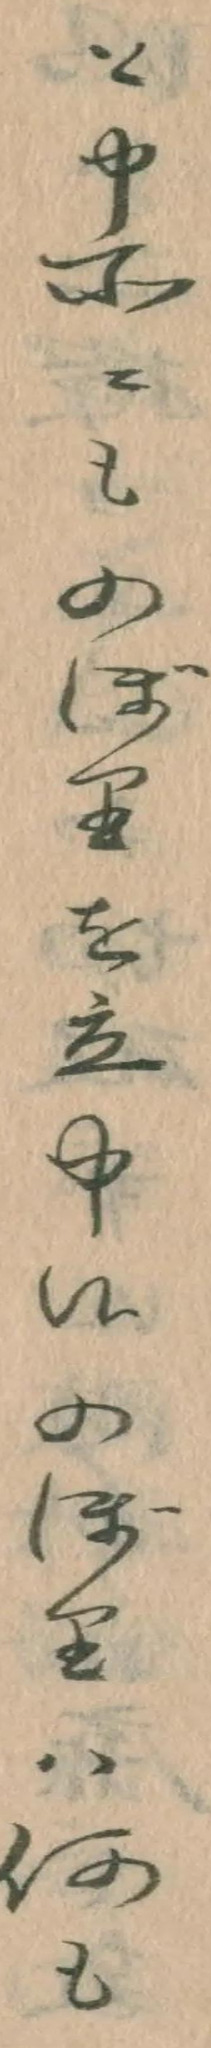と申所にものぼ里を立申候のぼ里は何も
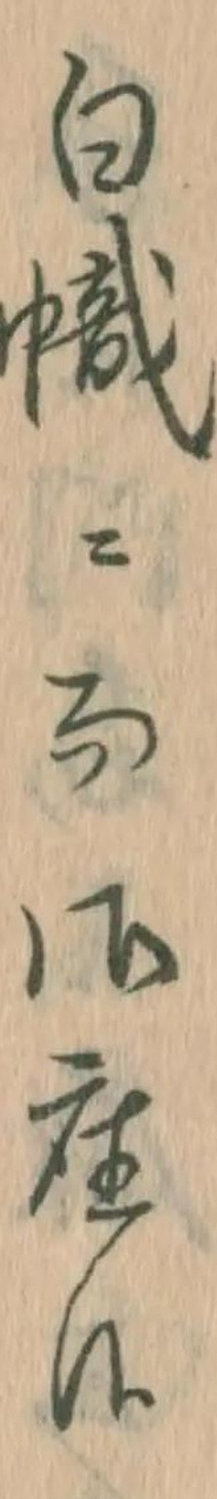白幟に而御座候
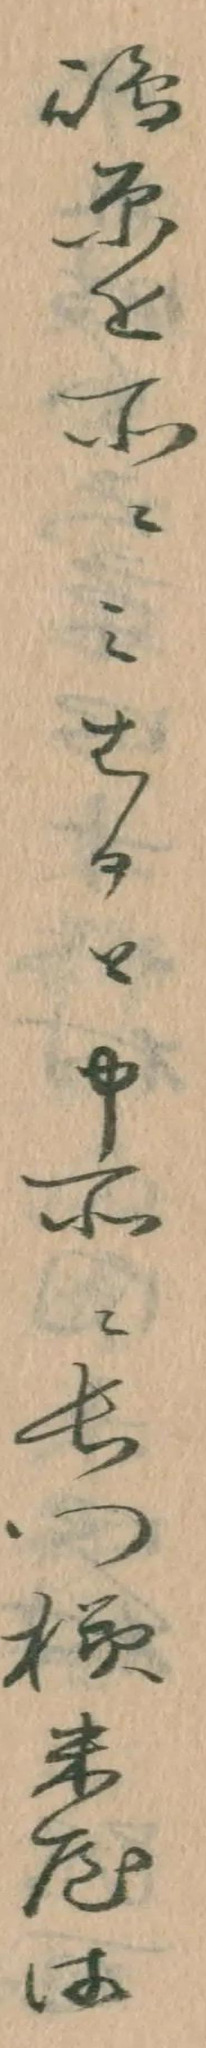一島原近所にみはると申所に長門様米屋御
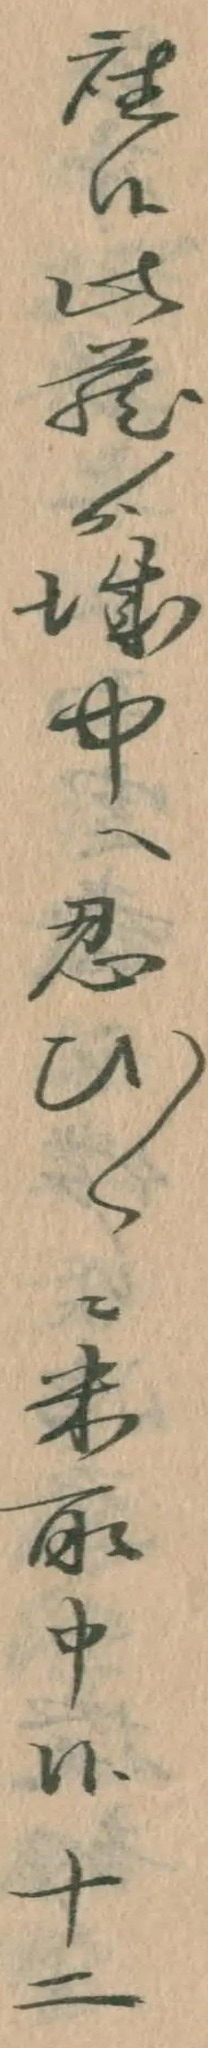座候此蔵ゟ城中へ忍ひ〱に米取申候十二
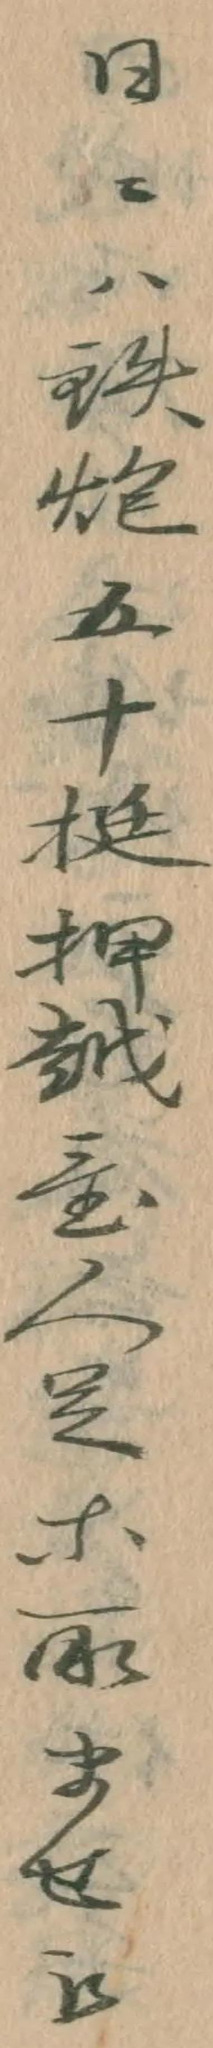日には鉄炮五十挺押越置人足等取ませ被
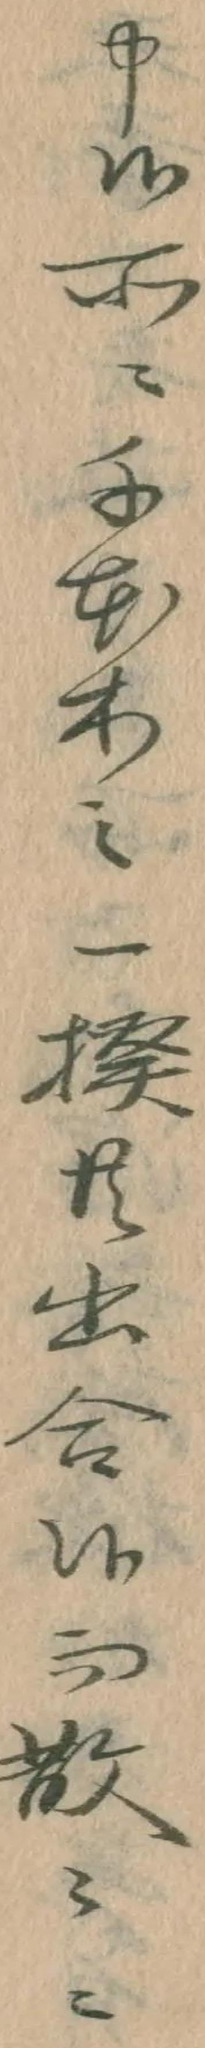申候処に千本木之一揆共出合候而散々に
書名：切支丹御退治記 49巻. [4]
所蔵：国立国会図書館 National Diet Library, JAPAN
